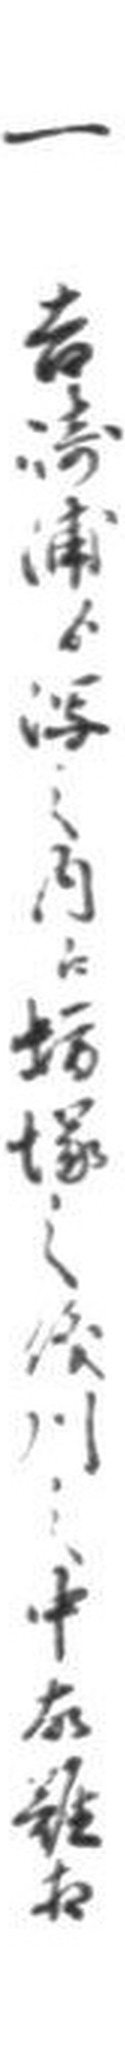一吉崎浦ゟ潟之内江坊塚之儀川之中故難相
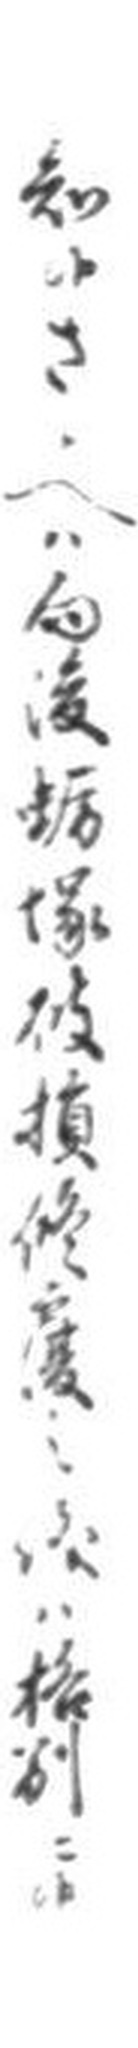知候さヽへハ向後坊塚破損修覆之儀ハ格別ニ候
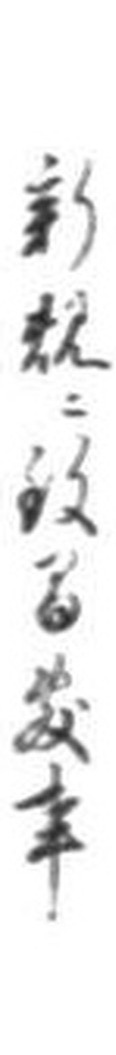新規ニ致間敷事
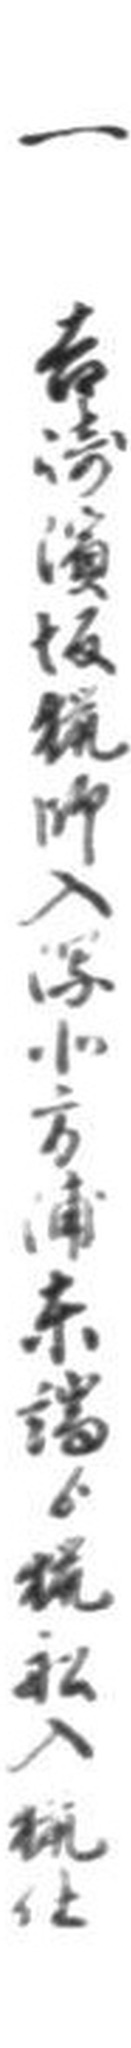一吉崎濱坂猟師入潟北方浦東端ゟ猟船入猟仕
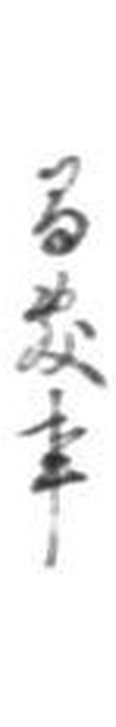間敷事
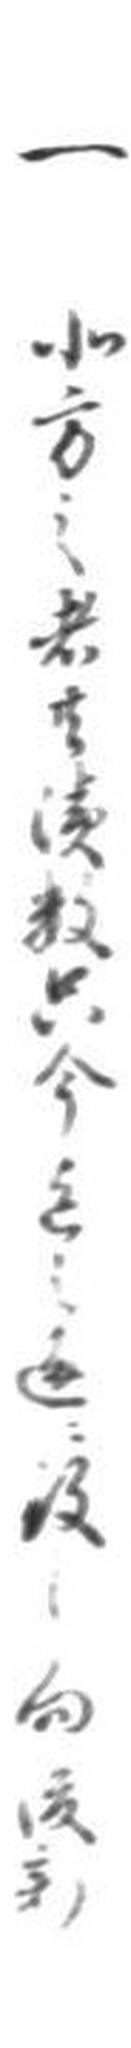一北方之者共漁数只今迄之通ニ致候向後新
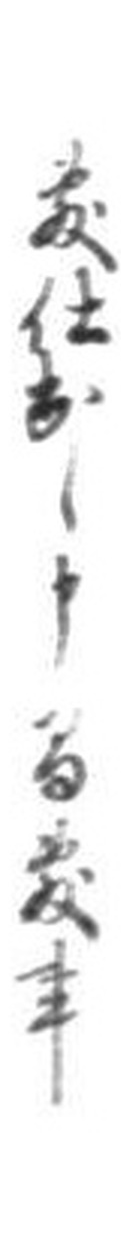敷仕出し申間敷事
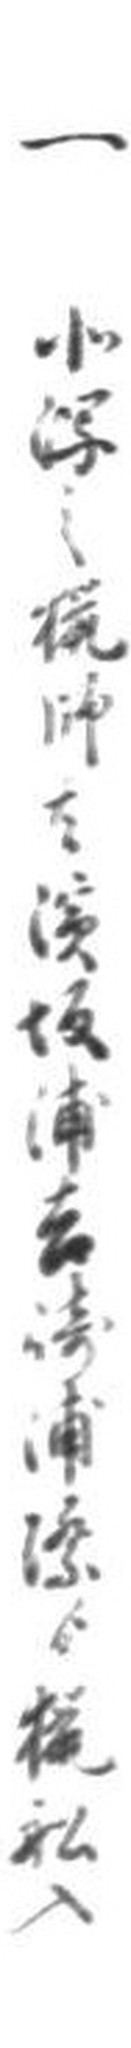一北潟之猟師共濱坂浦吉崎浦際ゟ猟船入
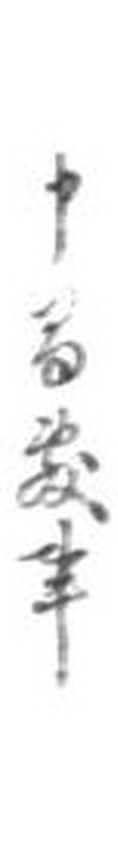申間敷事
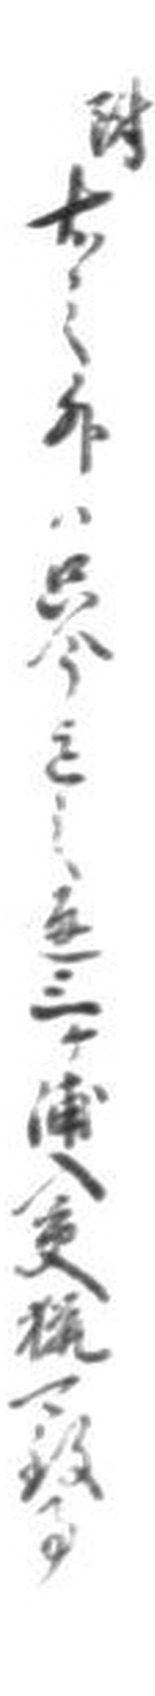右之外ハ只今迄之通三ケ浦入交猟可致事
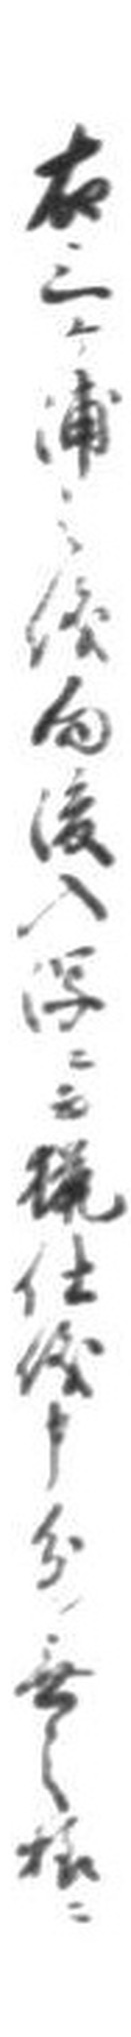右三ケ浦之儀向後入潟ニ而猟仕儀申分無之様ニ

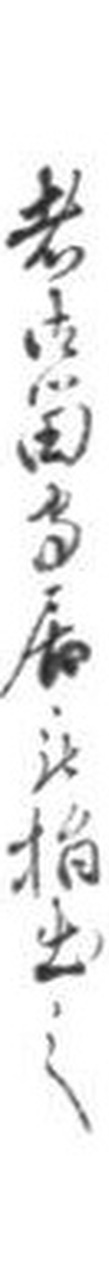者御留守居被指出之
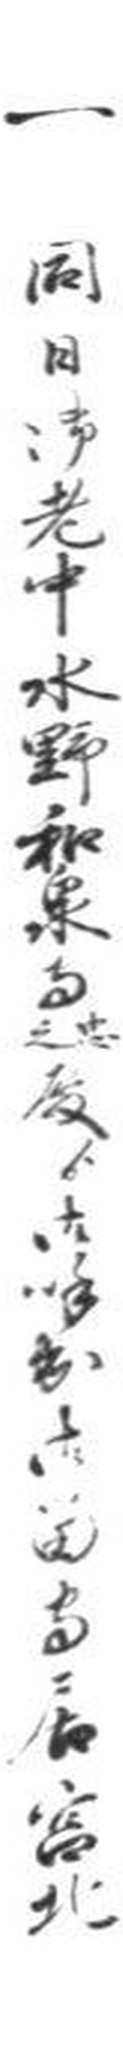一同日御老中水野和泉守忠之殿ゟ御呼出御留守居宮北
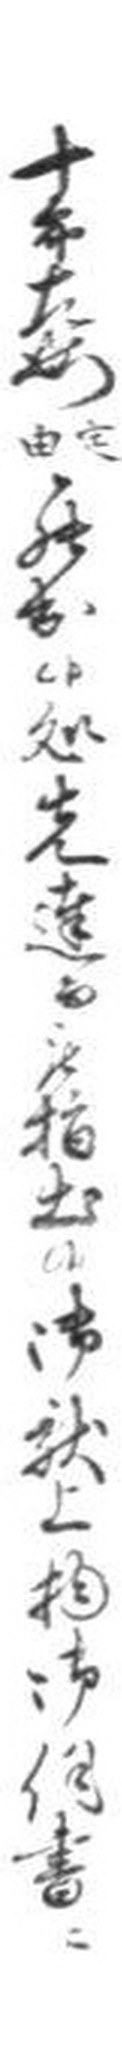十郎左衛門定由罷出候処先達而被指出候御献上物御伺書ニ
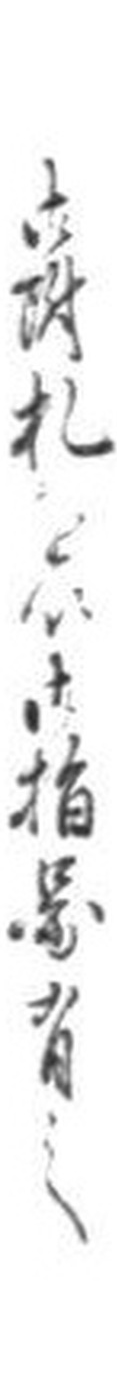御附札を以御指図有之
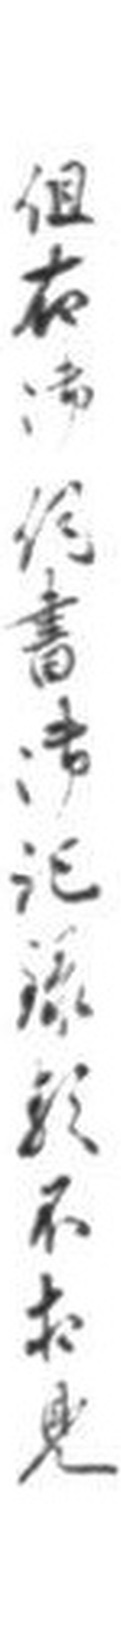但右御伺書御記録類不相見
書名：家譜 四十 宗矩公 従享保十一年到享保十二年
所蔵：福井県文書館 Fukui Prefectural Archives
